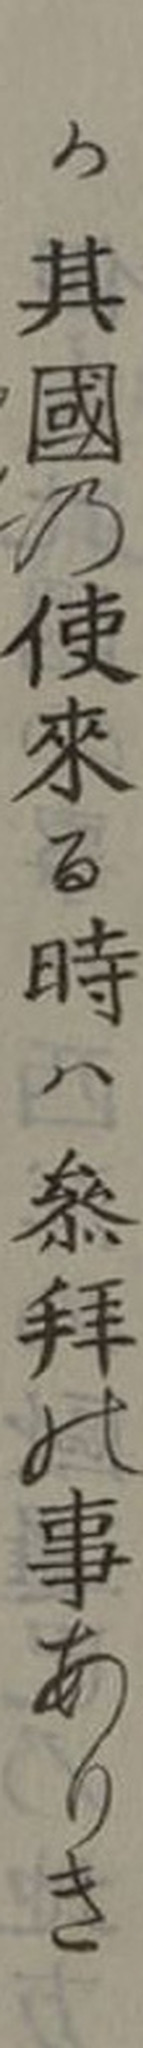か其國の使來る時は叅拜の事ありき
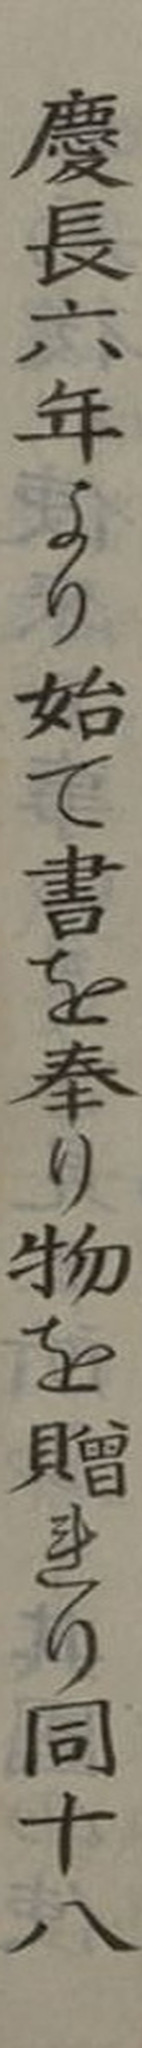慶長六年より始て書を奉り物を贈れり同十八

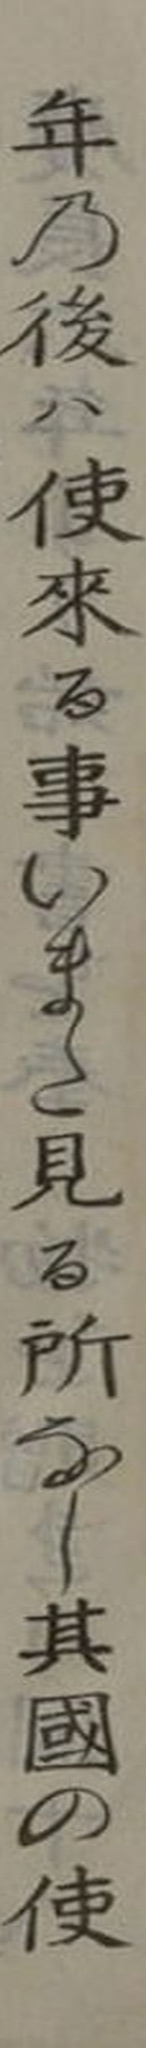年の後ハ使來る事いまた見る所なし其國の使
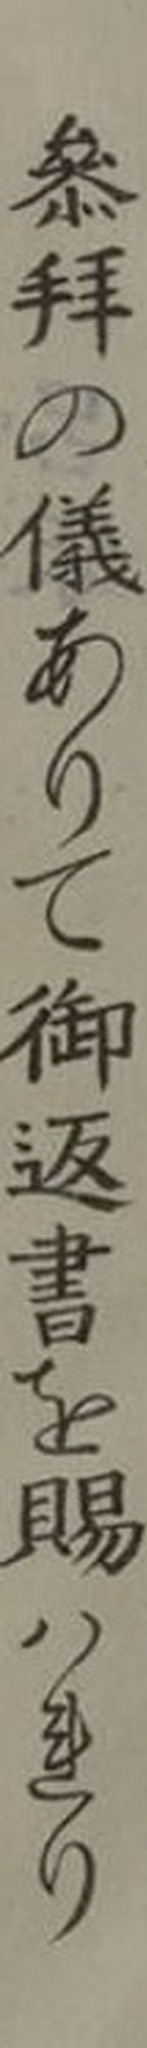叅拜の儀ありて御返書を賜ハれり
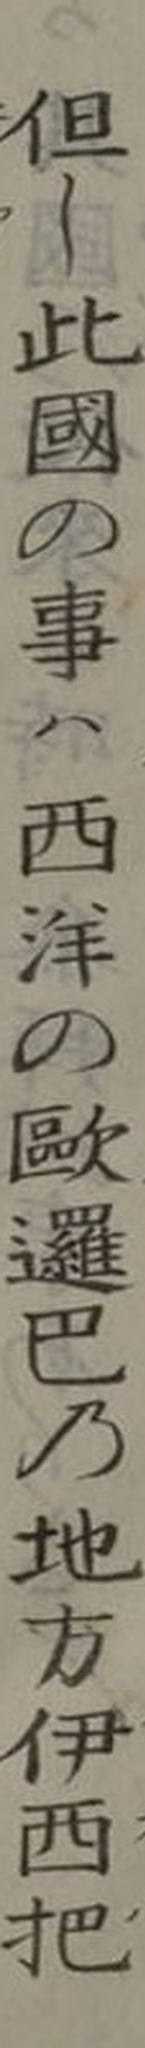但し此國の事ハ西洋の歐邏巴の地方伊西把
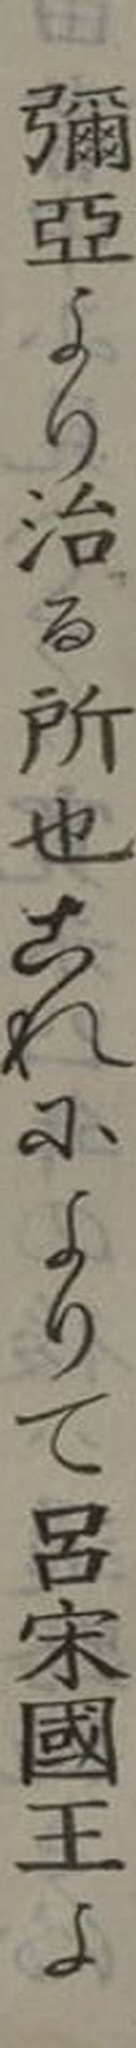彌亞より治る所也これによりて呂宋國王よ
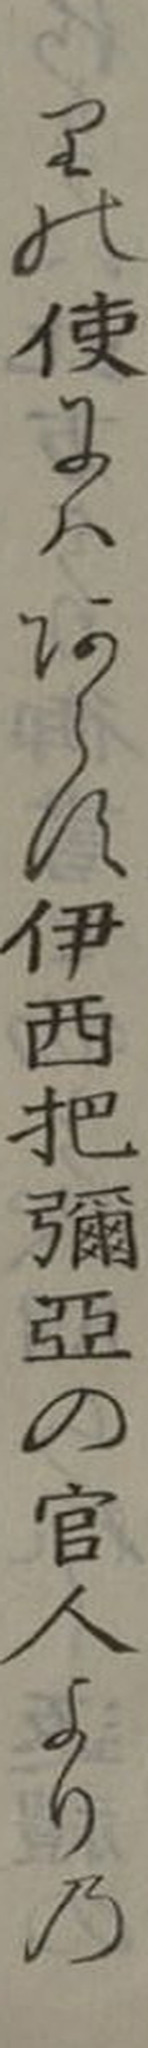りの使にハあらす伊西把彌亞の官人よりの
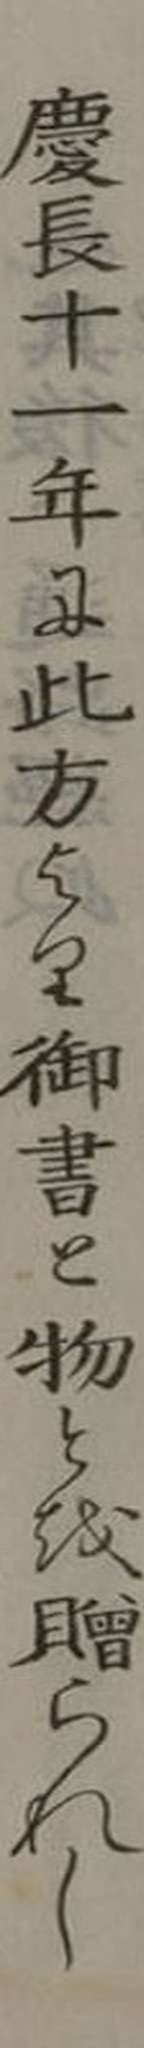慶長十一年に此方より御書と物とを贈られし
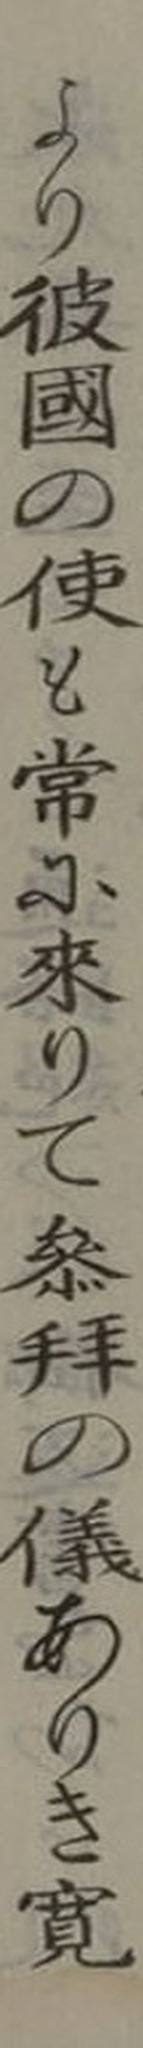より彼國の使も常に來りて叅拜の儀ありき寛
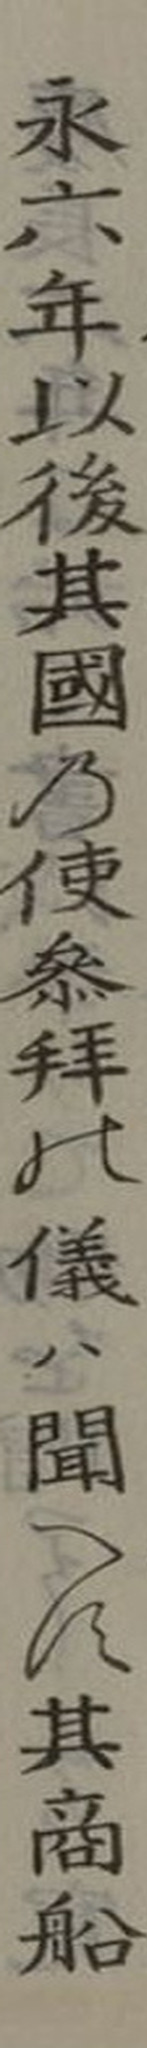永六年以後其國の使叅拜の儀ハ聞へす其商船
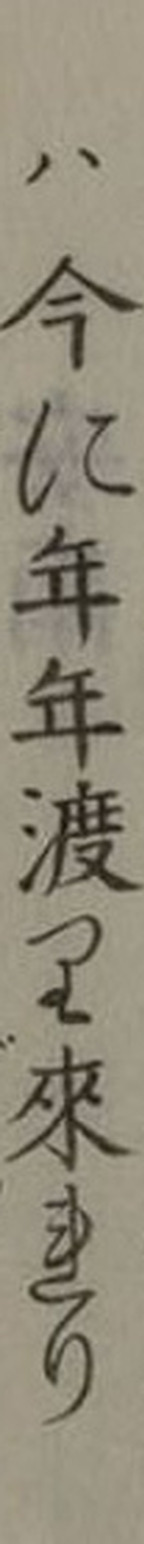ハ今に年年渡り來れり
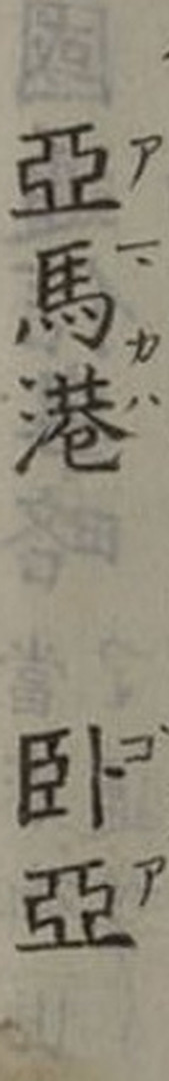亞馬港卧亞
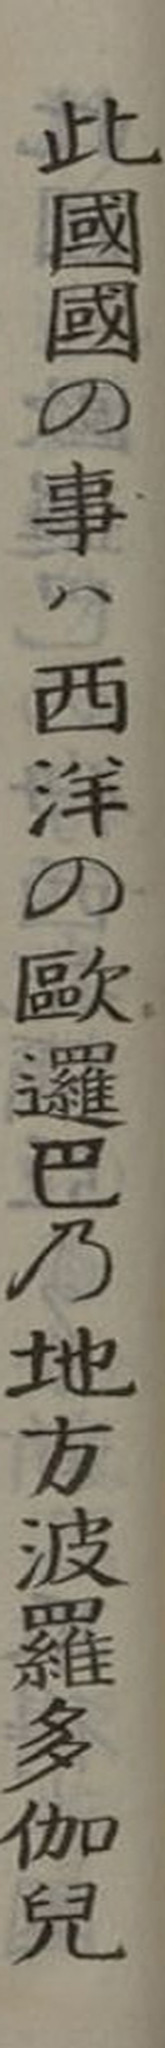此國國の事ハ西洋の歐邏巴の地方波羅多伽兒
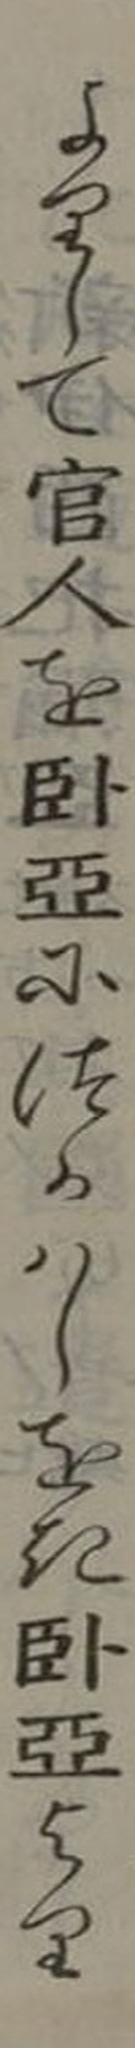よりして官人を卧亞につかハしをき卧亞より
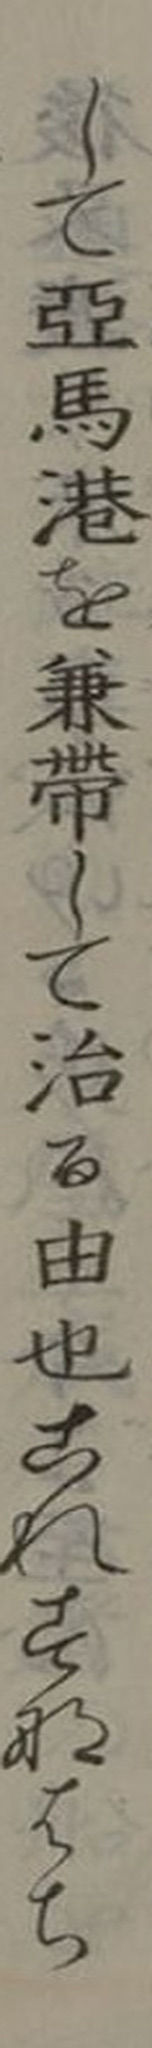して亞馬港を兼帶して治る由也これすなはち
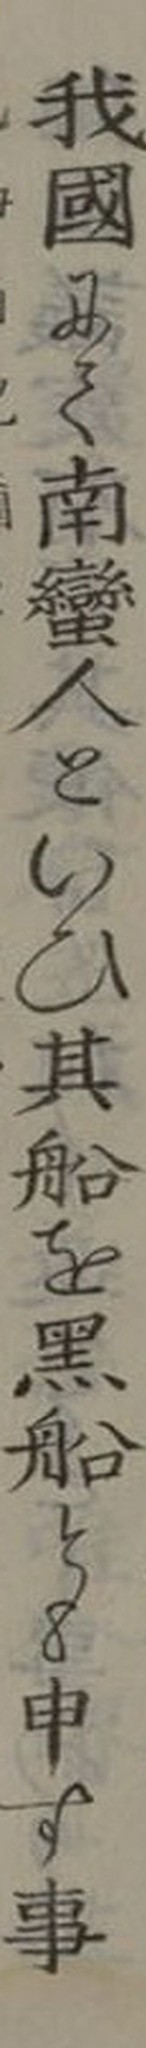我國にて南蠻人といひ其船を黑船とも申す事
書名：骨董録
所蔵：University of the Ryukyus Library
